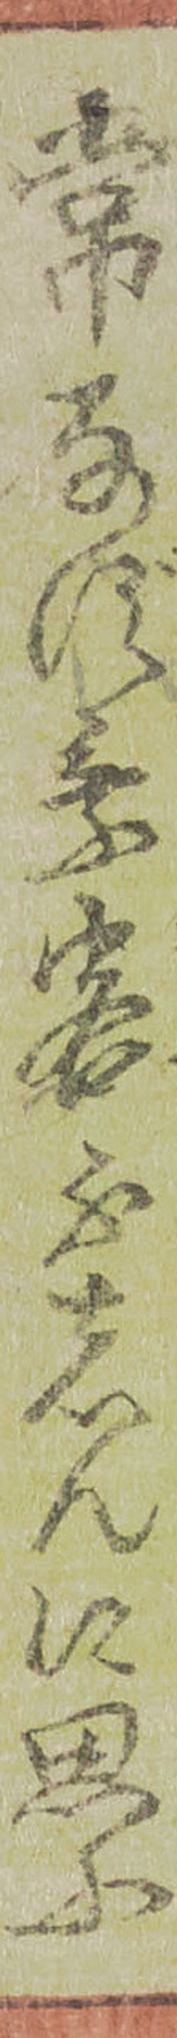常なず乗客ふしんに思ふ
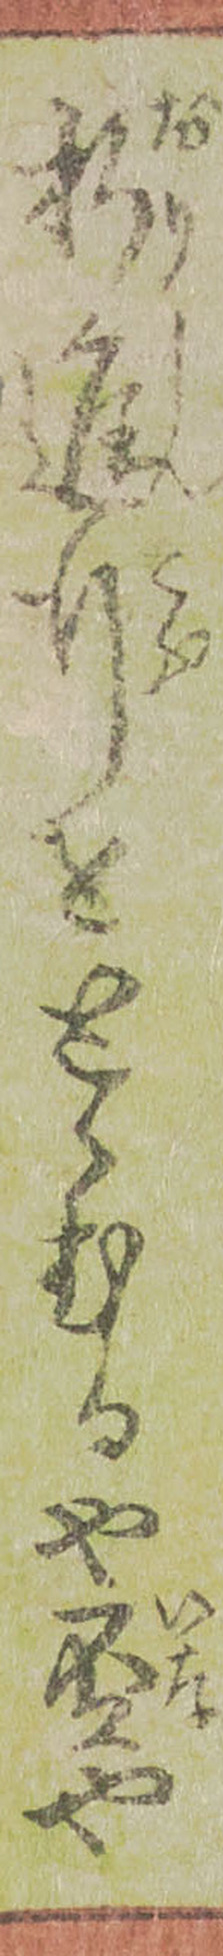折進行をとゝむるや否や

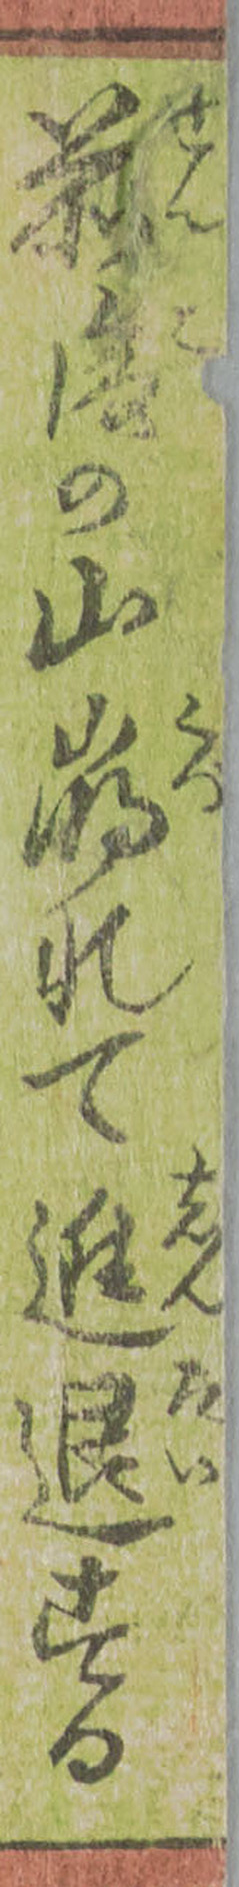前后の山崩れて進退する
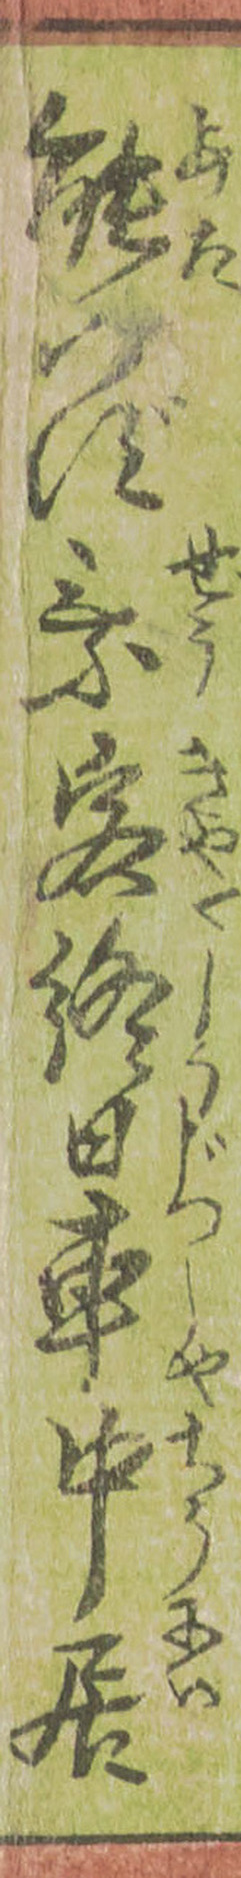能はず乗客終日車中居
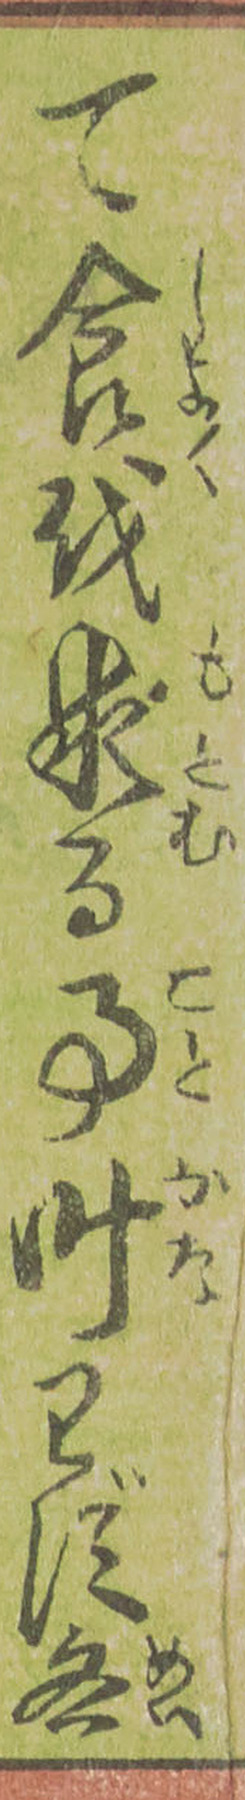て食を求る事叶わず各
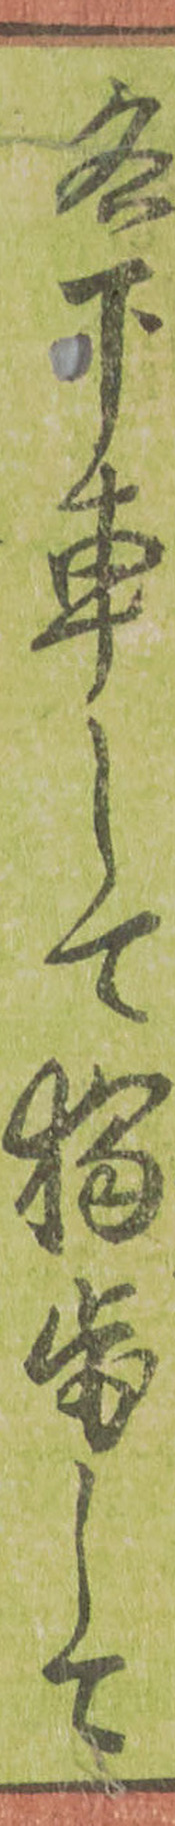各下車して獨歩して
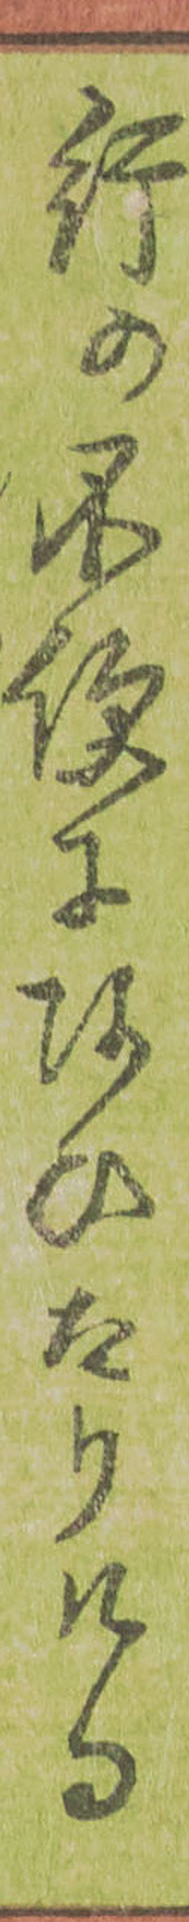行の不便にあひたりける
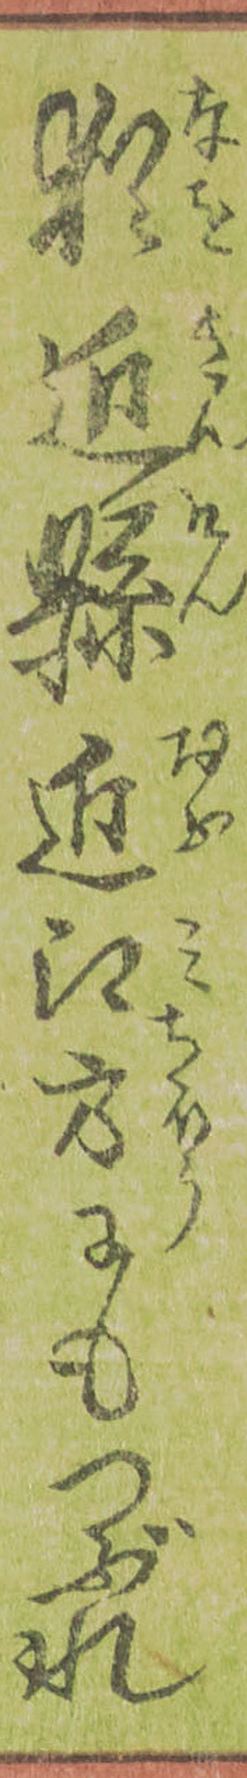猶近縣近江方にもつぶれ
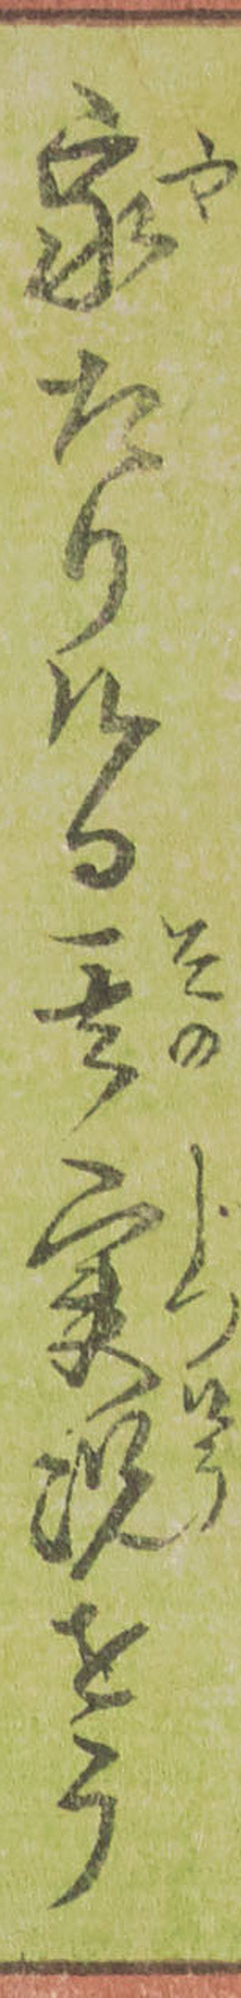家有りける其実況をう
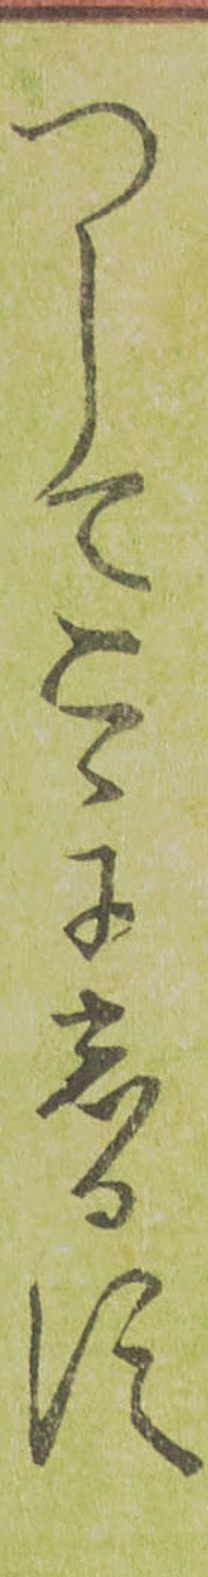つしてこゝにしるす
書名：岐阜市街大地震之図
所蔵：東京大学総合図書館 General Library in the University of Tokyo, JAPAN
